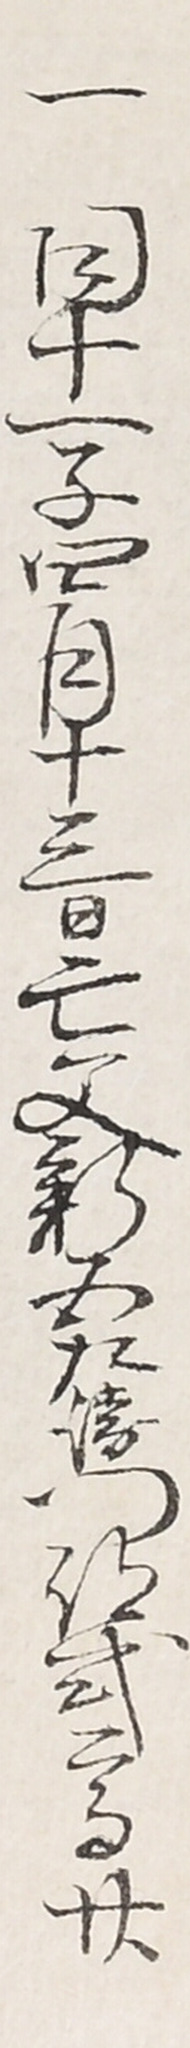一同十一子四月十三日亡父新五左衛門跡式高廿
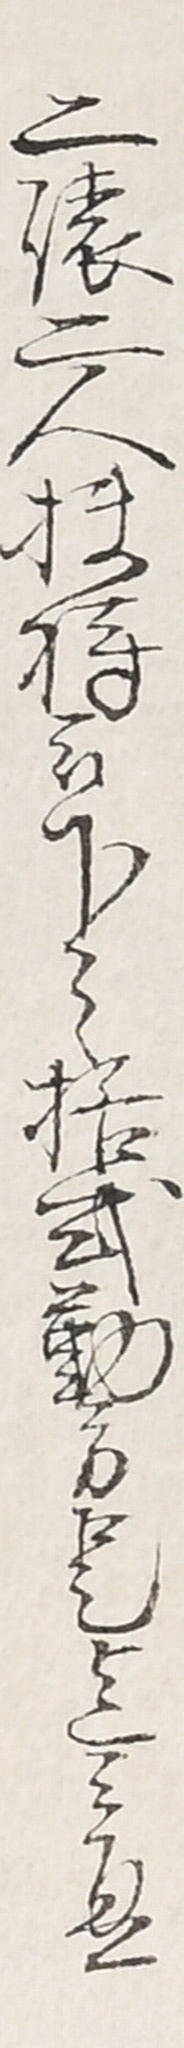二俵二人扶持被下之格式勤方是迄之通
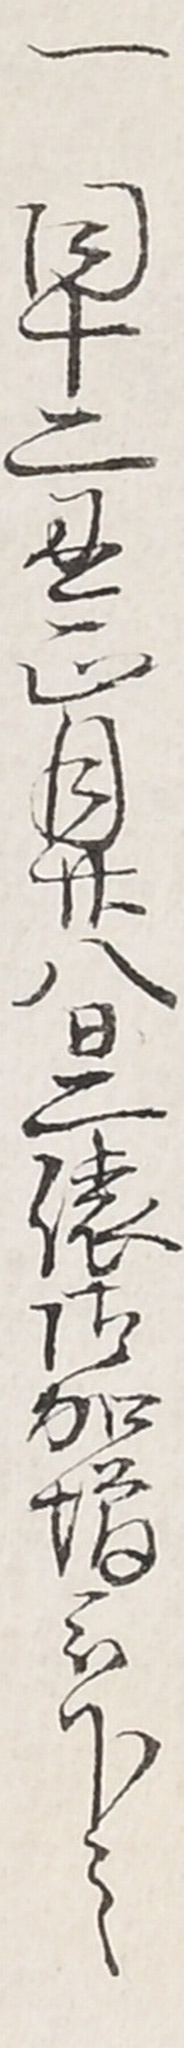一同十二丑正月廿八日二俵御加増被下之
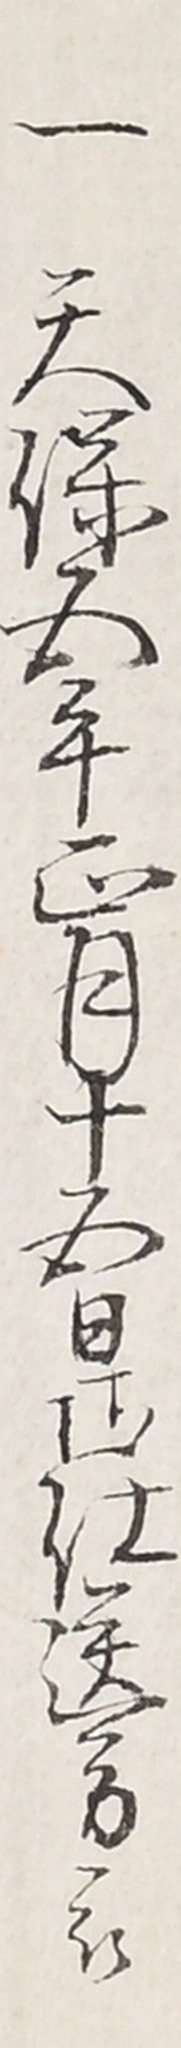一天保五午正月十五日御仕送方被
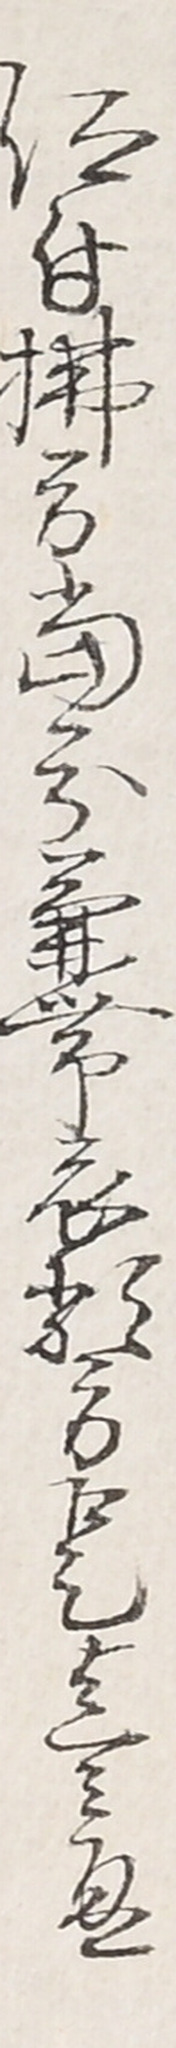仰付払方当分兼帯衣類方是迄之通
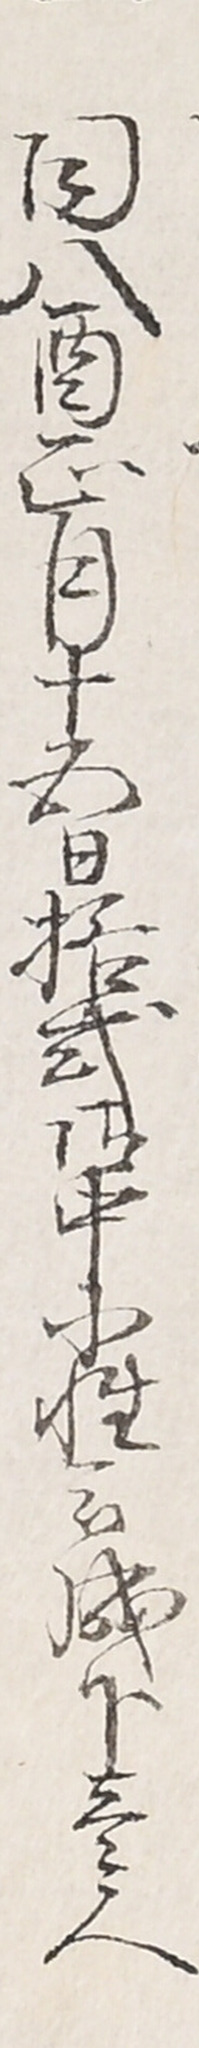一同八酉正月十五日格式御中小性被成下壱人
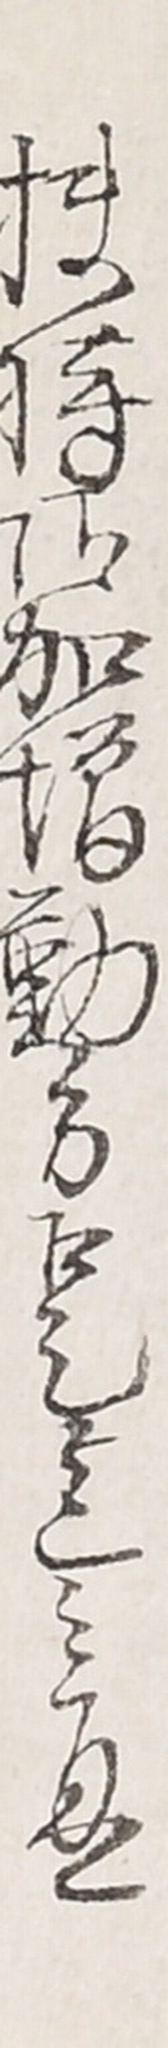扶持御加増勤方是迄之通
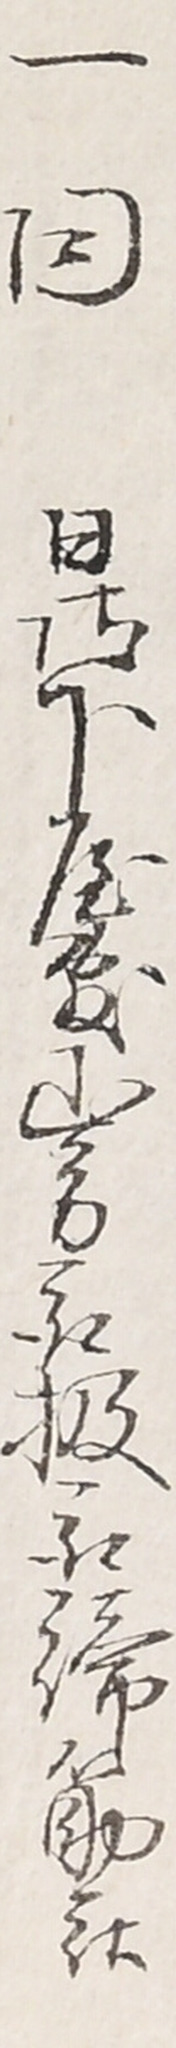一同日御下屋敷山方取扱取締筋被
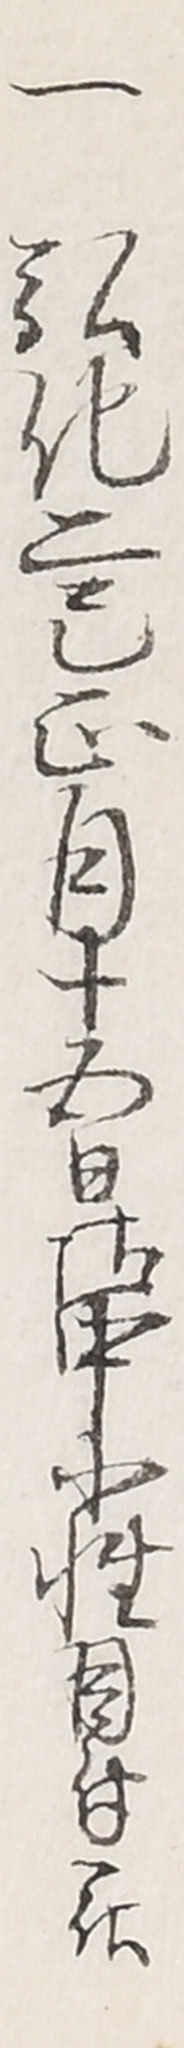一弘化二巳正月十五日御中小性目付被
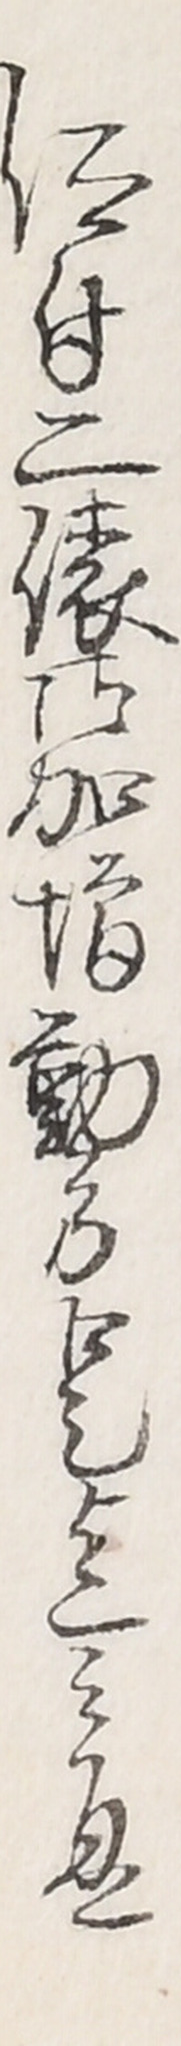仰付二俵御加増勤方是迄之
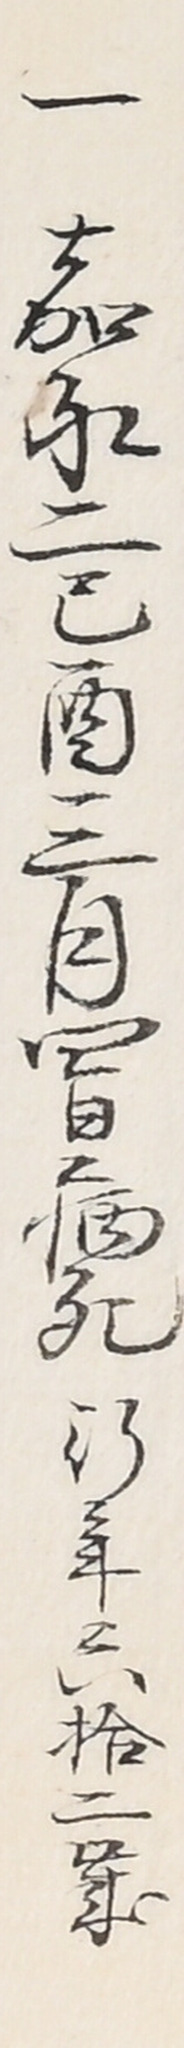一嘉永二己酉三月四日病死行年六拾二歳
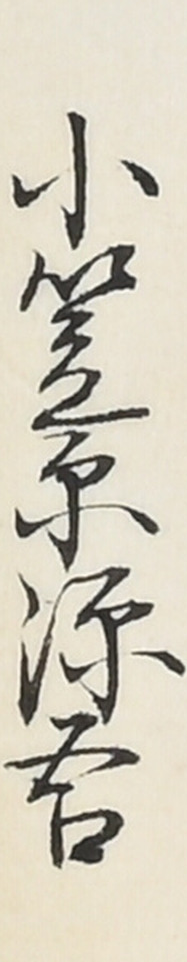小笠原源吾
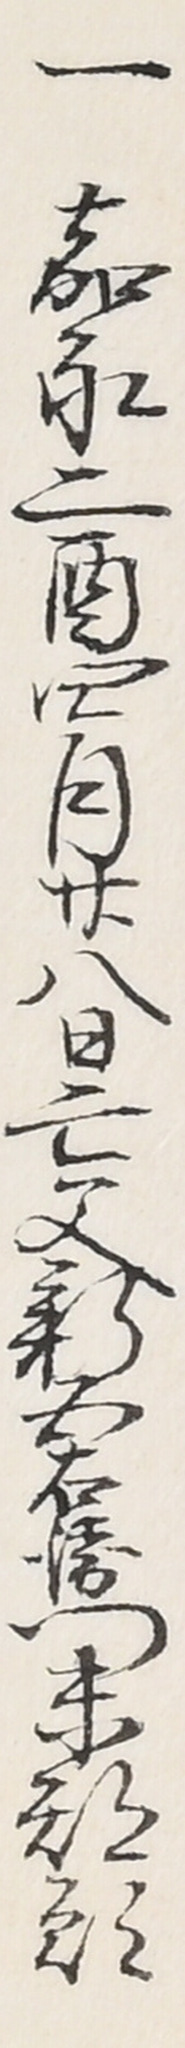一嘉永二酉四月二十八日亡父新五右衛門末期願
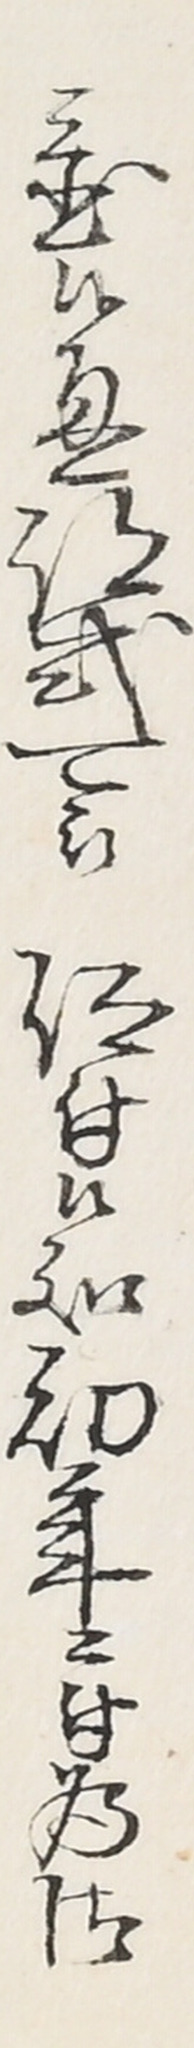置候通跡式可被仰付候処幼年ニ付為御
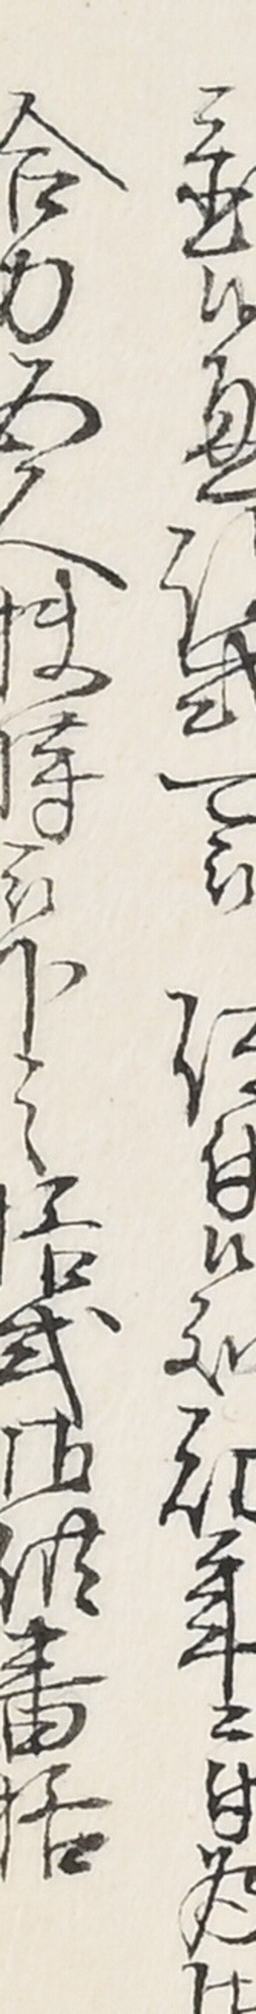合力五人扶持被下之格式御供番格
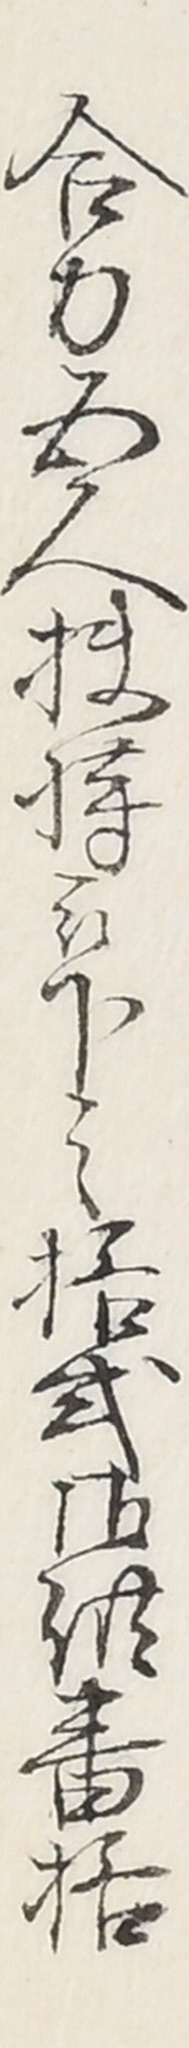合力五人扶持被下之格式御供番格
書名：無足諸士勤仕録（四）
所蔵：伊那市立高遠町図書館・合同会社AMANE
